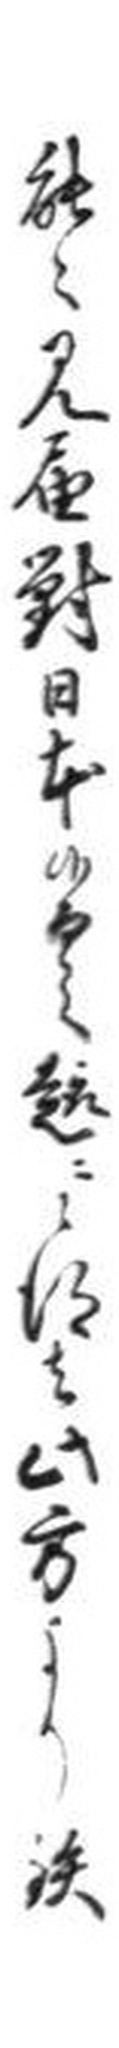能々見届対日本候而之趣ニ候得者此方より鉄
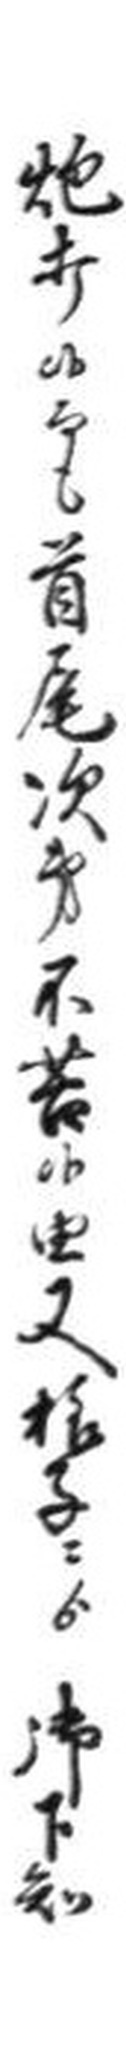炮打候而も首尾次第不苦候由又様子ニゟ御下知
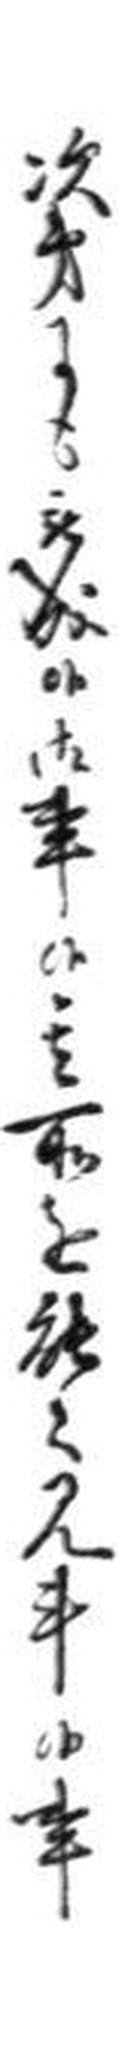次第にも被成候御事候其所を能々見計候事
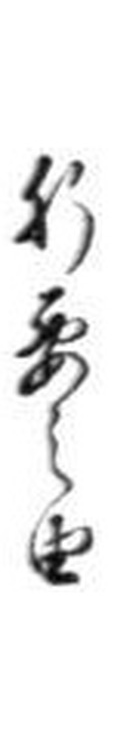肝要之由
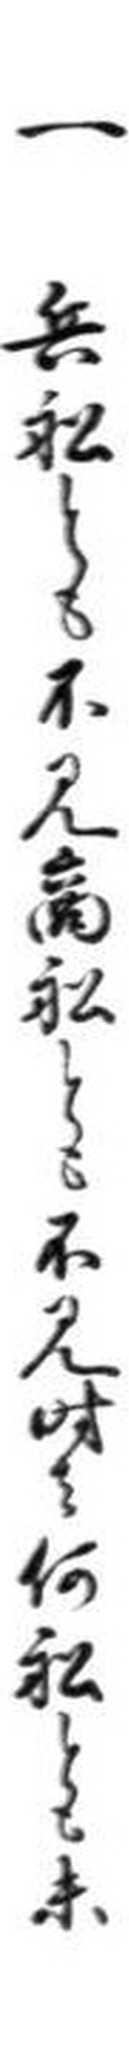一兵船とも不見商船とも不見時者何船とも未
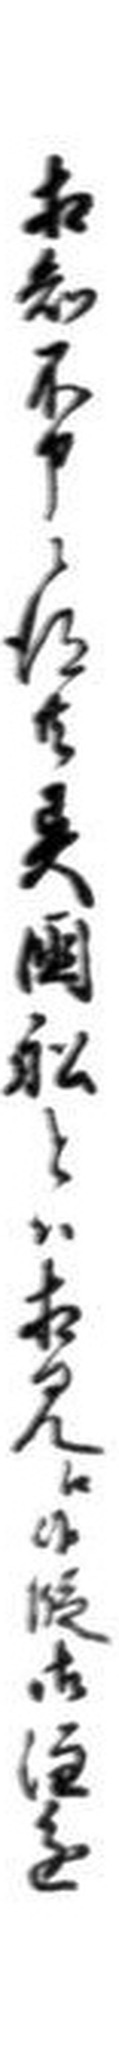相知不申候得共異国船とハ相見江候段御注進
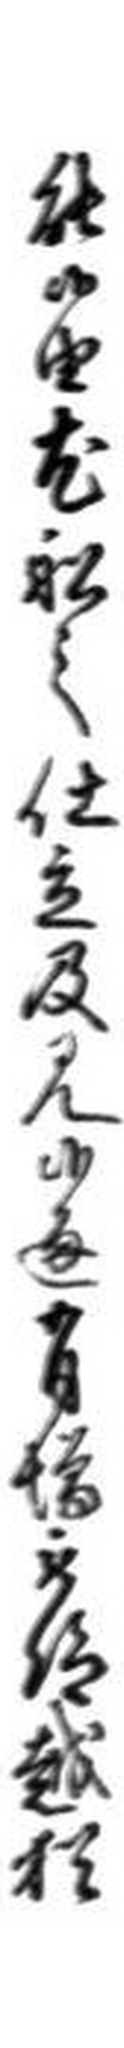能候由尤船之仕立及見候通有増被仰越猶
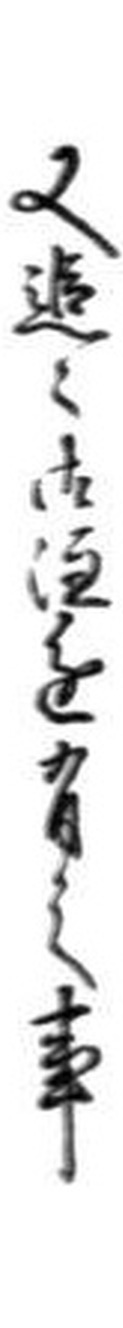又追々御注進有之事
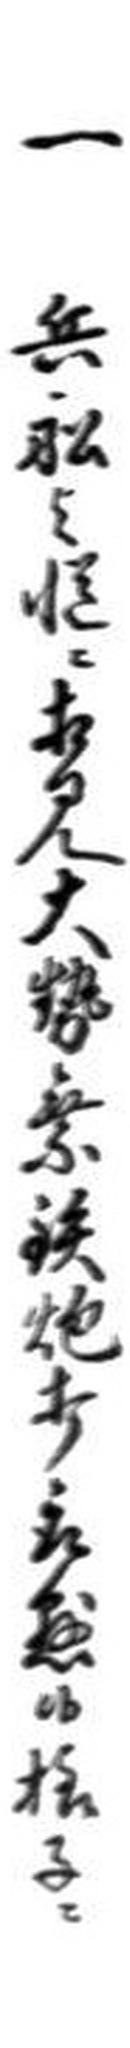一兵船与慥ニ相見大勢乗鉄炮打取懸候様子ニ
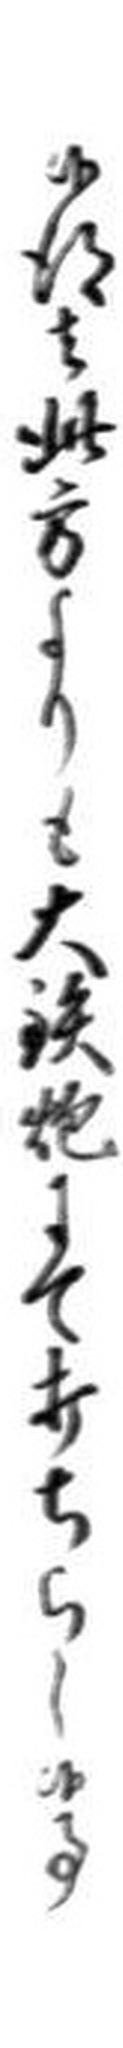候得者此方よりも大鉄炮にて打ちらし候事
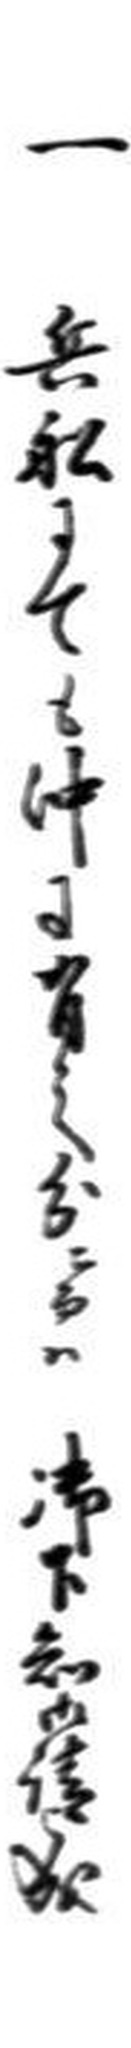一兵船にても沖に有之分ニ而ハ御下知御請被成
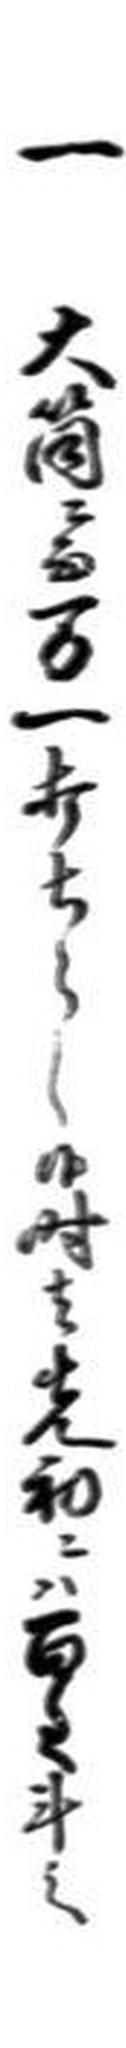一大筒ニ而万一打ちらし候時者先初ニハ百匁斗之
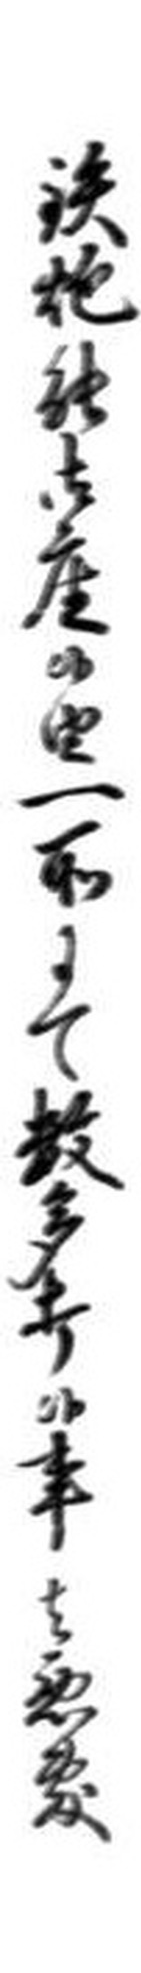鉄炮能御座候由一所にて数多打候事者悪敷
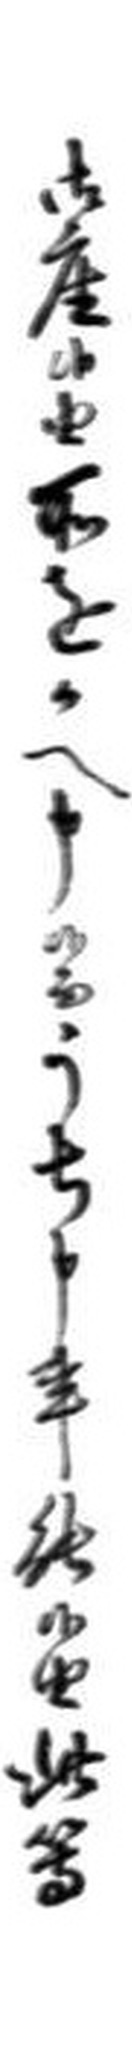御座候由所をかへ申候而うち申事能候由此等

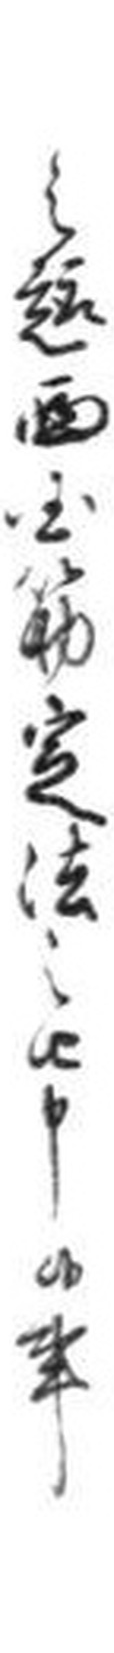之趣西国筋定法之由申候事
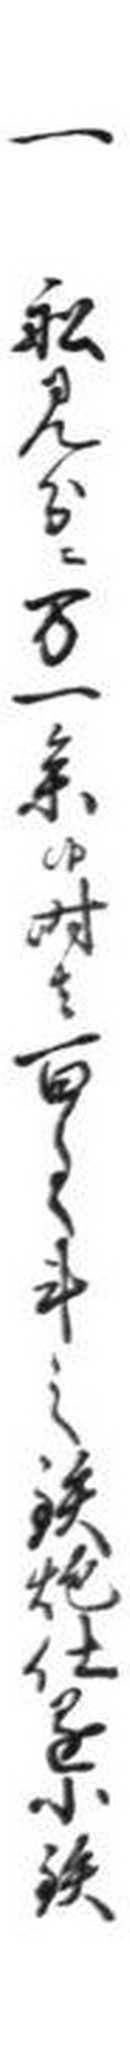一船見分ニ万一参候時者百匁斗之鉄炮仕懸小鉄
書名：家譜 三十二 吉邦公 従享保二年到享保三年
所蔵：福井県文書館 Fukui Prefectural Archives
